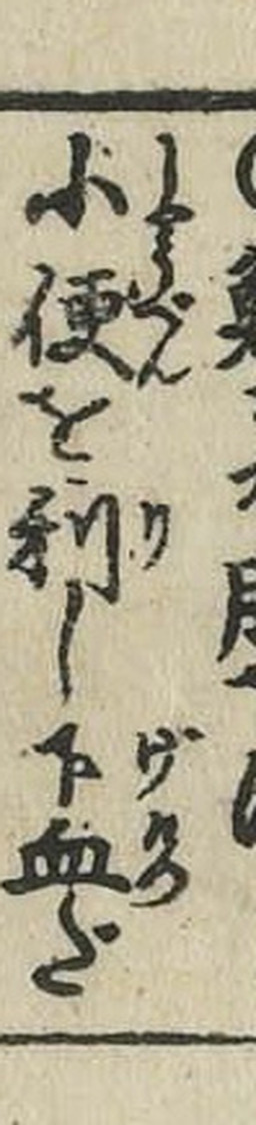小便を利し下血だ
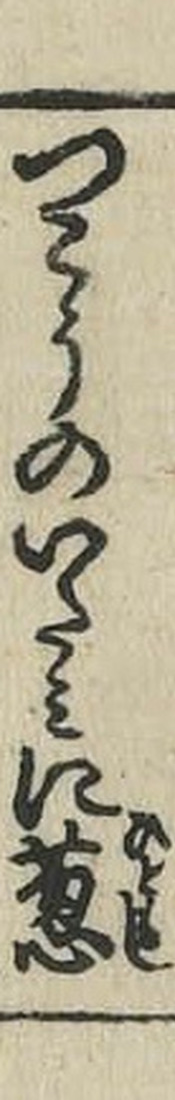つこうのいたみに葱
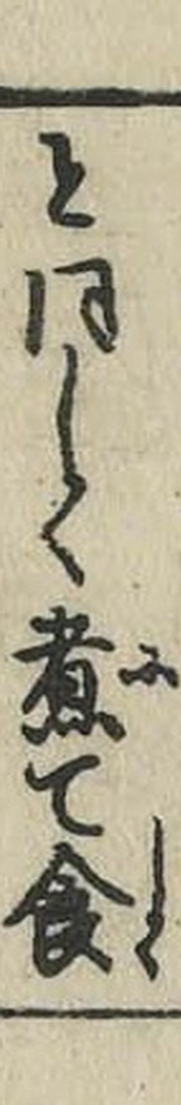と同しく煮て食
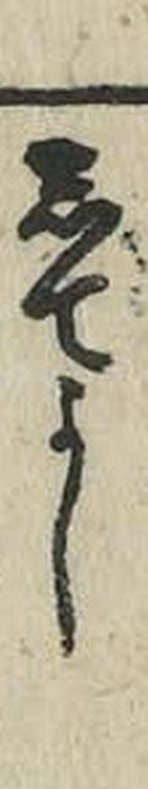してよし

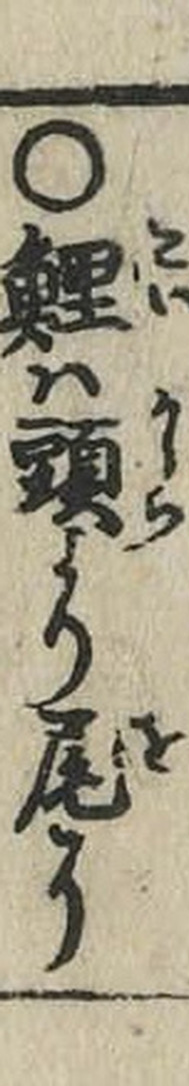○鯉は頭より尾に
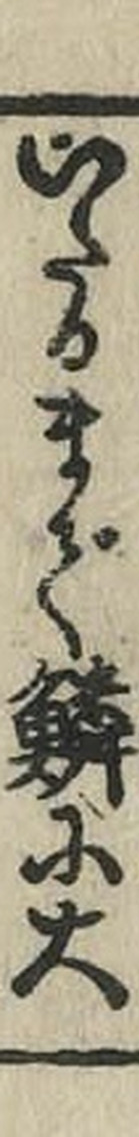いたるまで鱗に大
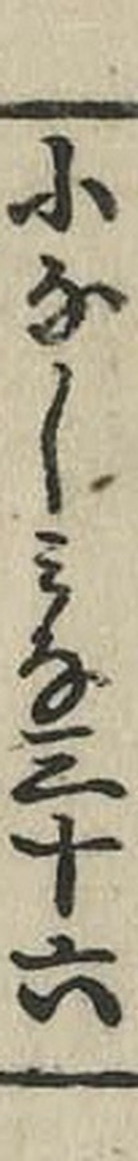小なしみな三十六
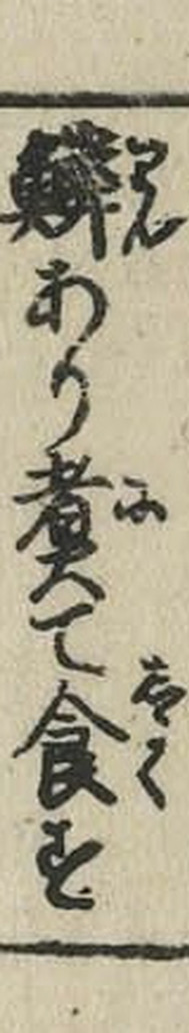鱗あり煮て食す
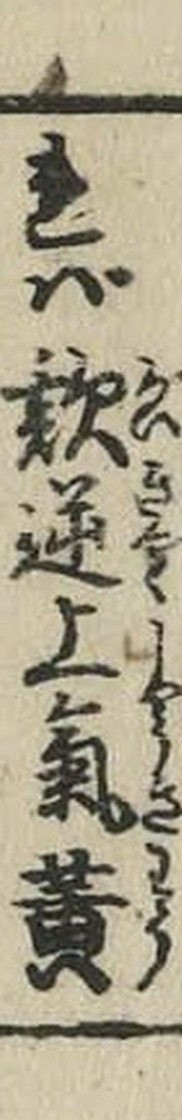れば欬逆上気黄
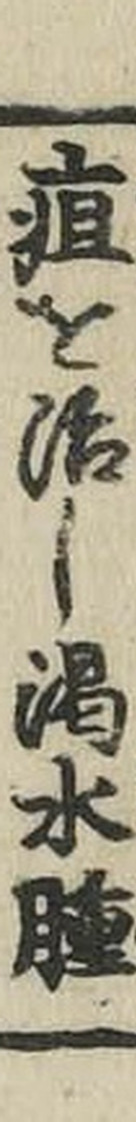疸を治し渇水腫
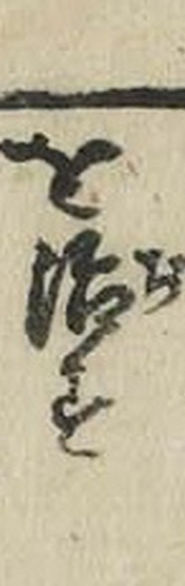を治す
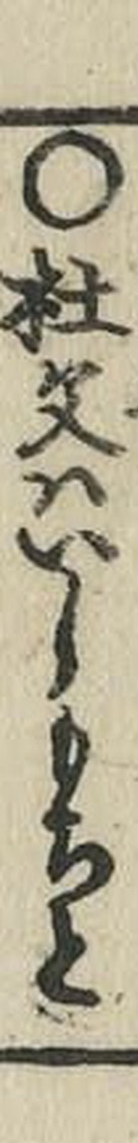○杜父はいしもちと
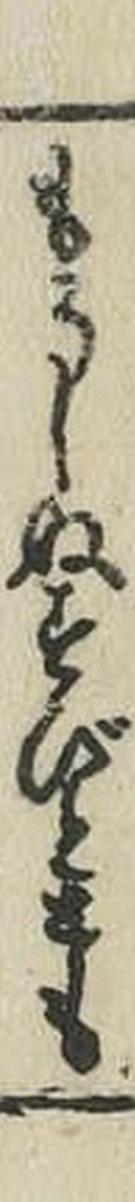もうしぬすびととも
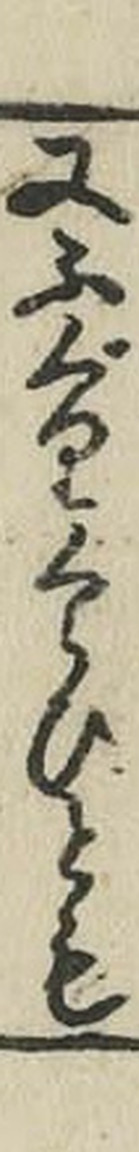又ふぐりくらひとも
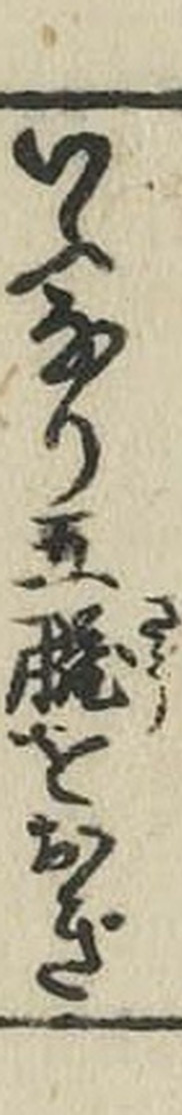いふなり五臓をおぎ
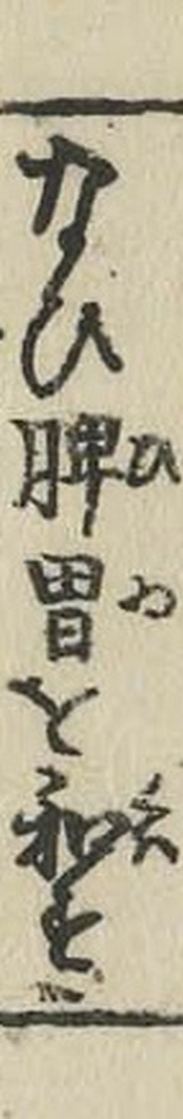なひ脾胃を和す
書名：増補頭書訓蒙図彙大成 10巻 7:巻之14-16
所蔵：東京学芸大学教育コンテンツアーカイブ
